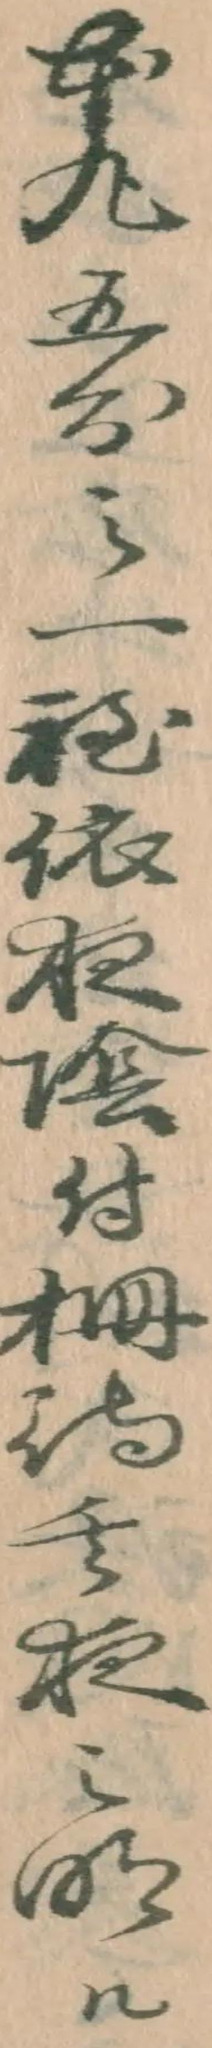本丸五分之一程依夜陰付柵待其夜之明る
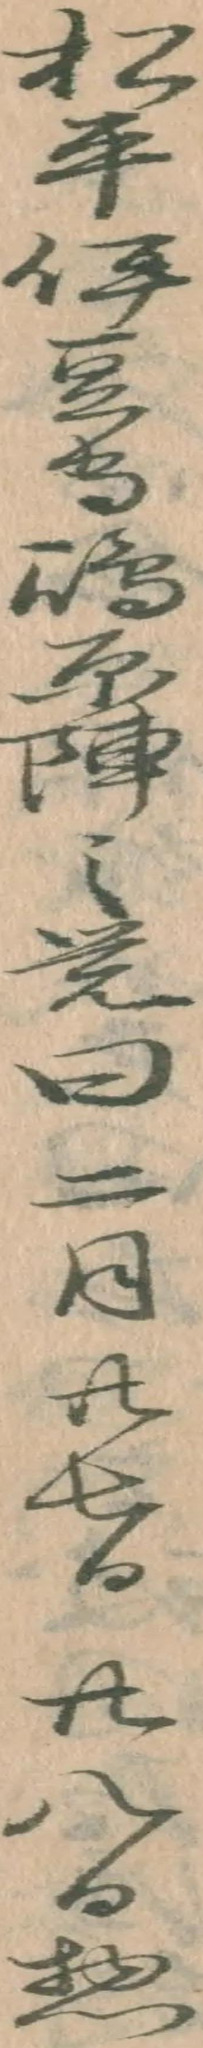松平伊豆守島原陣之覚曰二月廿七日廿八日惣
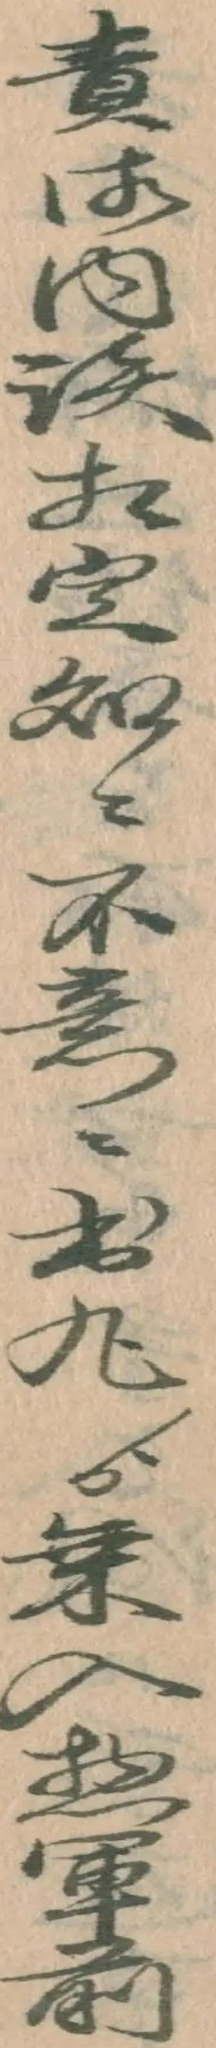責御内談相定処に不意に出丸ゟ乗入惣軍前
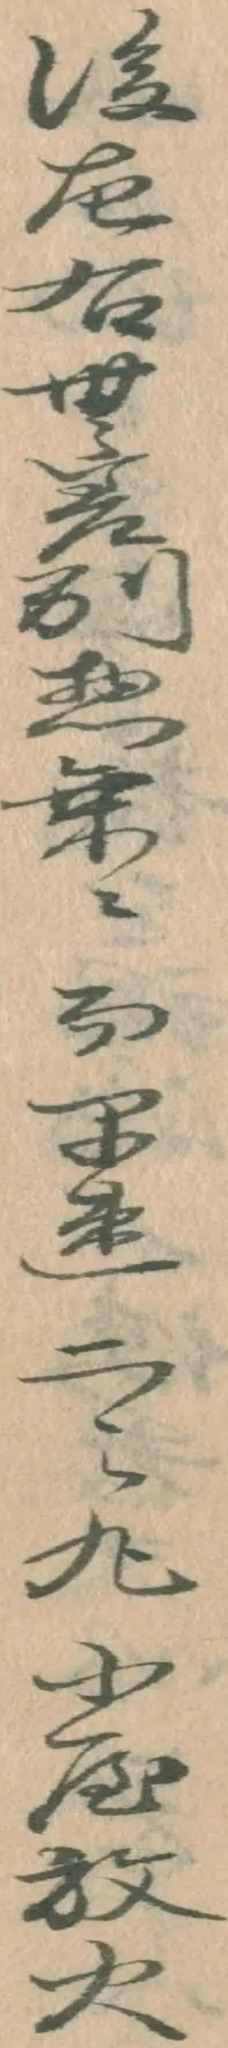後左右無差別惣乗に而早速二之丸小屋放火
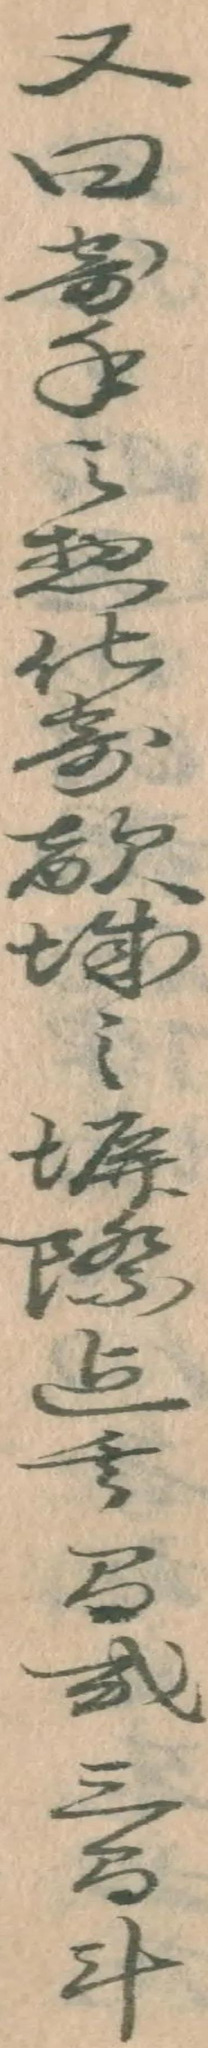又曰寄手之惣仕寄敵城之塀際迄其間或三間斗
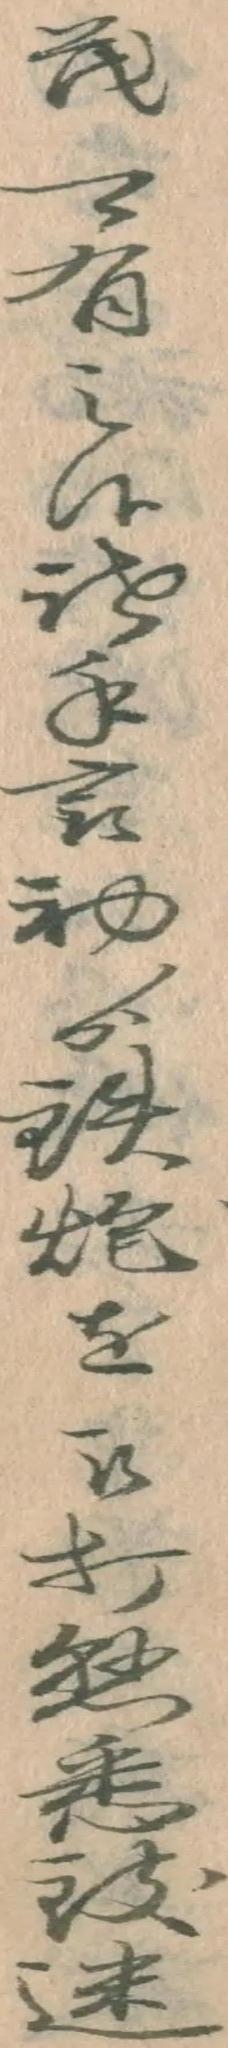茂可有之候諸手最初ゟ鉄砲を被打懸悉致迷
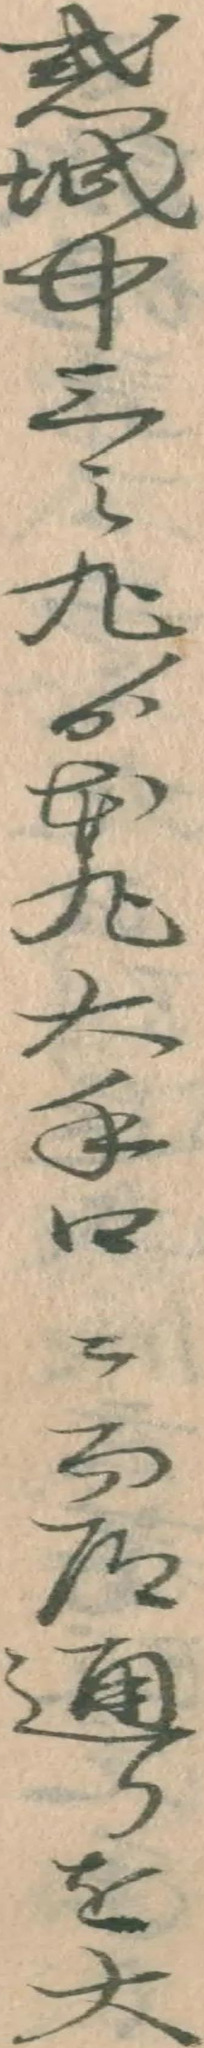惑城中三之丸ゟ本丸大手口に而道通りを大
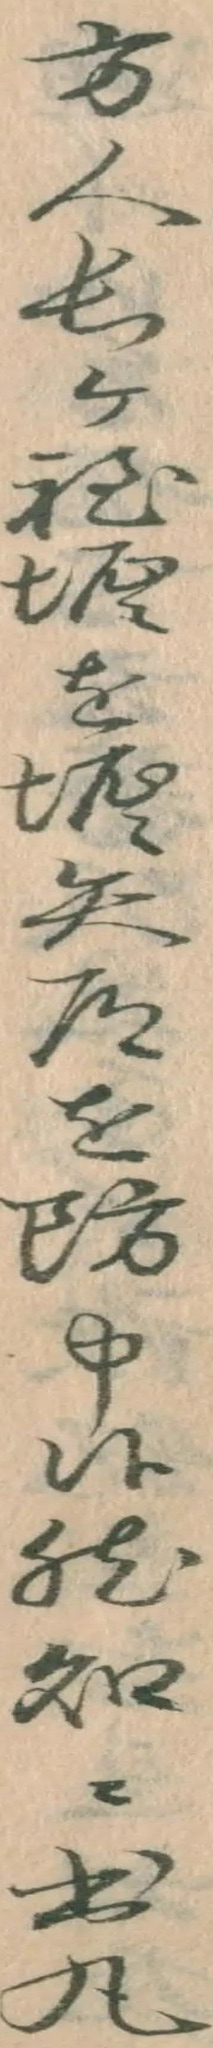方人長け程堀を堀矢道を防申候然処に出丸
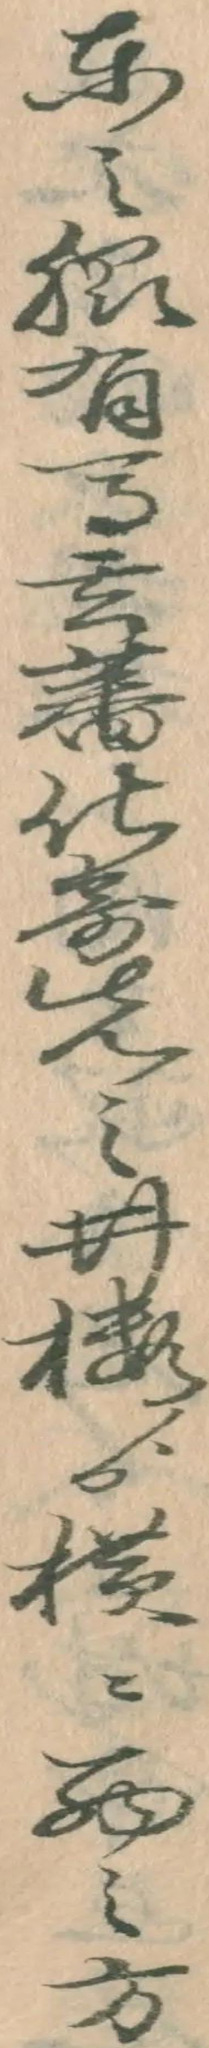東之脇有馬玄蕃仕寄先之井樓ゟ横に西之方

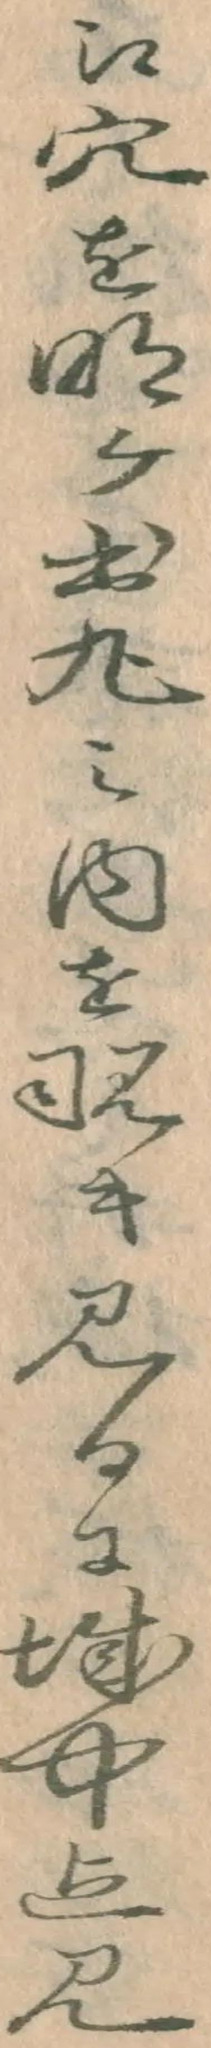江穴を明け出丸之内を覗き見る尓城中迄見
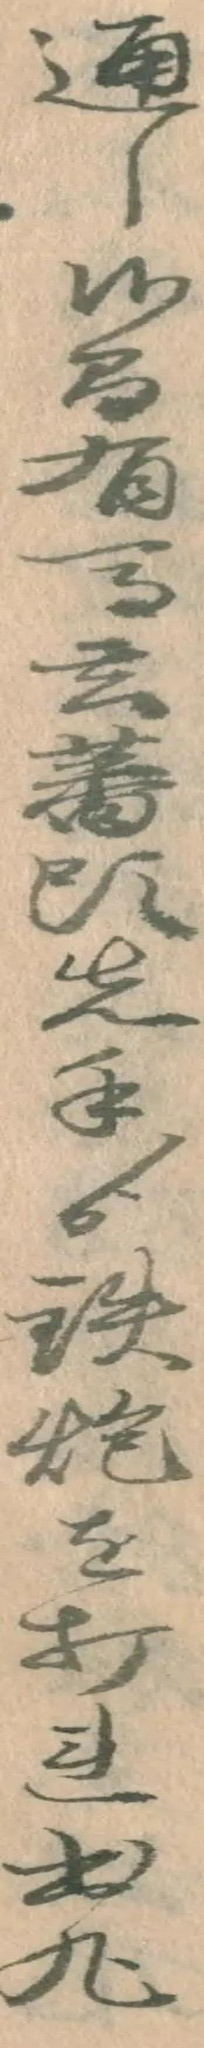通し候間有馬玄蕃頭先手ゟ鉄砲を打連出丸
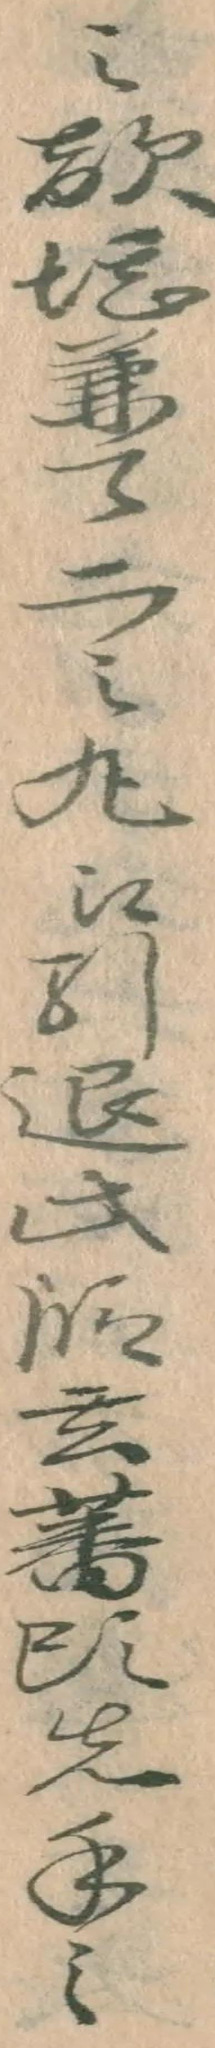之敵堪兼て二之丸江引退此段玄蕃頭先手之
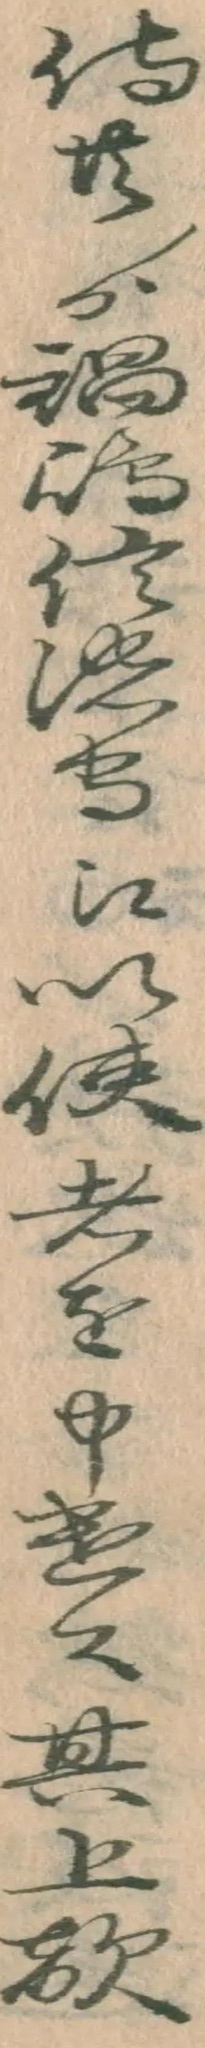侍共ゟ鍋島信濃守江以使者を申遣す其上敵
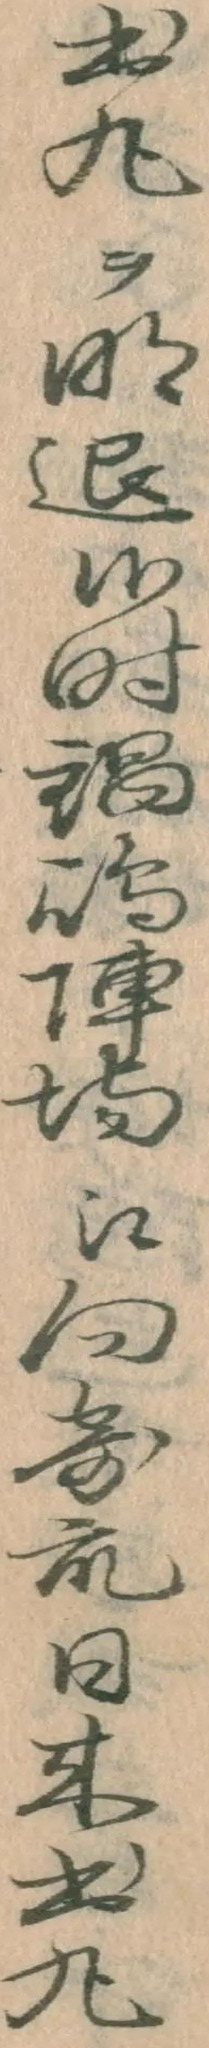出丸を明退候時鍋島陣場江向寄衆日来出丸
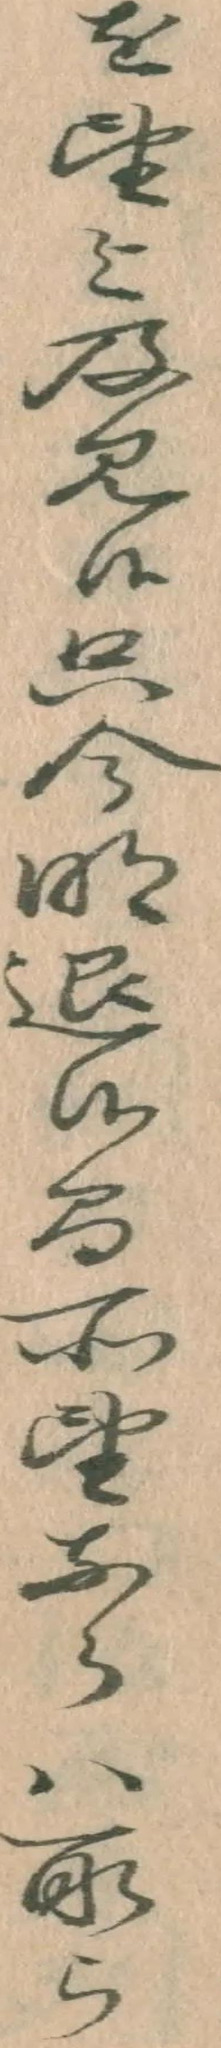を望与及見候只今明退候間所望ならは取ら
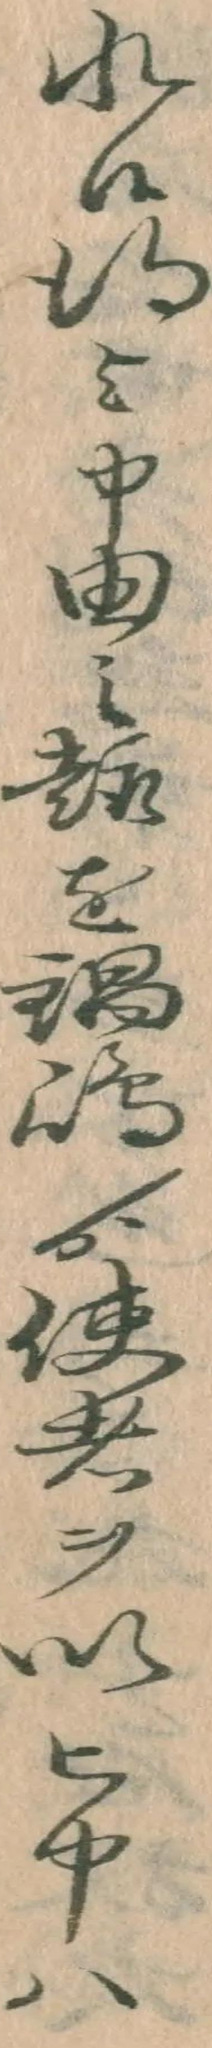れ候得与申由之趣を鍋島ゟ使者を以被申は
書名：切支丹御退治記 49巻. [8]
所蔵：国立国会図書館 National Diet Library, JAPAN
